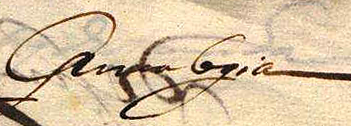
Genealogia
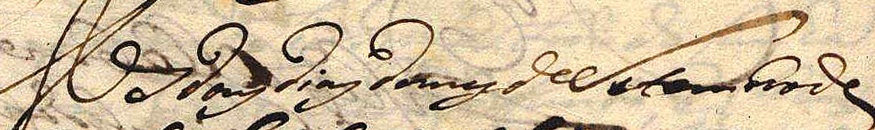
Aos dous dias do mes de Setembro de
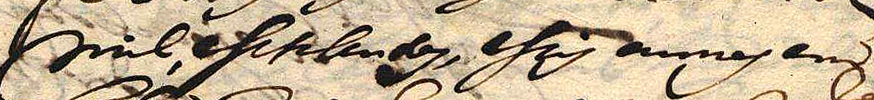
mil, e setecentos, e seis aunos em
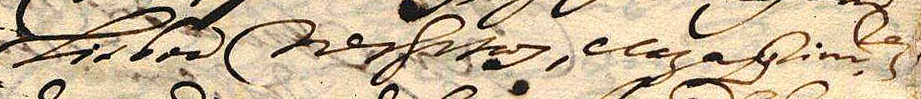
Lisboa nos estaos, e casa prim.ra
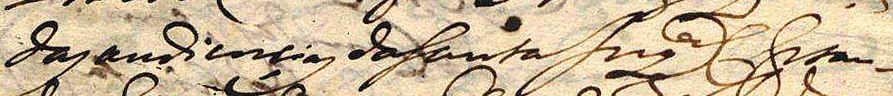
das audiencias da santa Jnqçaõ Estan
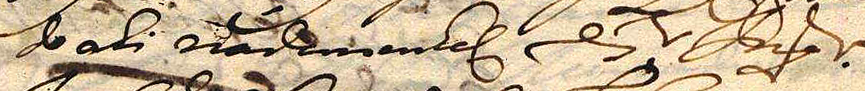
do ahi na de manhā o sr Inqor.
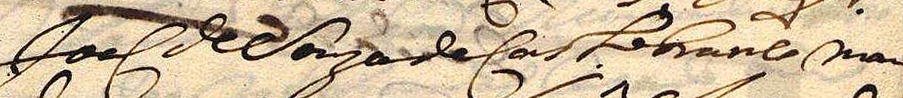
Joaõ de Souza de Cast.o branco man
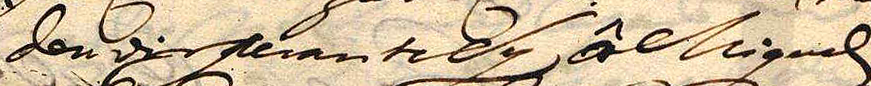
dou vir perante Sy â Miguel
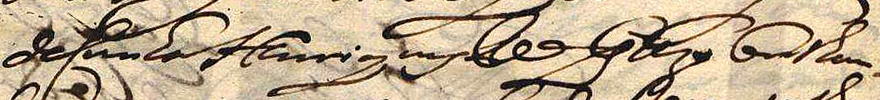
de Cunha Henriques Reo pRezo Contheu
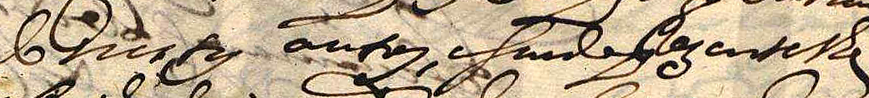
do nestes autos, e sendo pRezente lhe
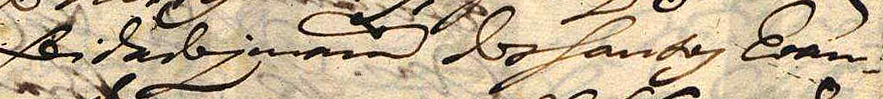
foi dado juramo dos santos Evam
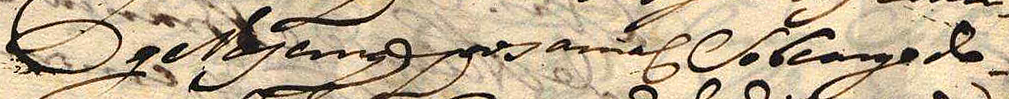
gelhos em q̄ pos a maõ Sob cargo do
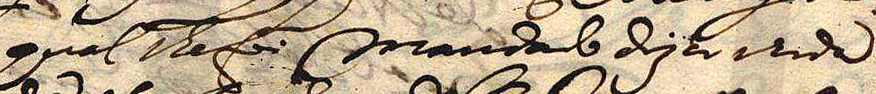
qual lhe foi mandado dizer verda
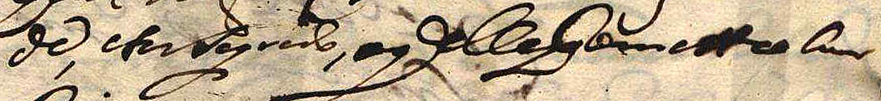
de, e ter segredo, o q̄ elle pRometteo cum
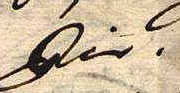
pRir.
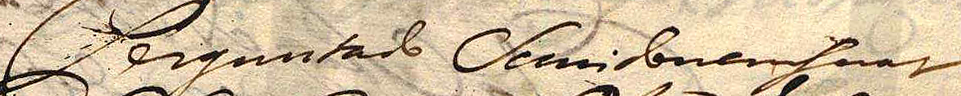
Perguntado Se cuidou em suas
